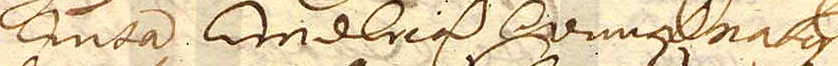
Conta Com o Criaõ E viuiaõ na Ley
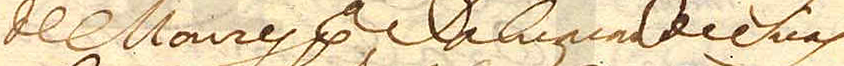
de Mouzes pa Saluacaõ de Suas
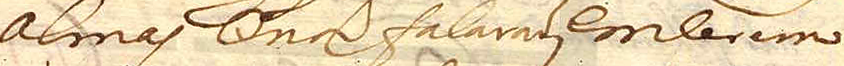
almas E naõ falaraõ Em Ceremo
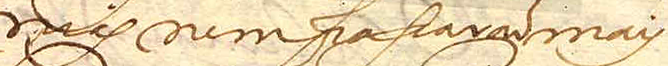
nias nem passaraõ mais
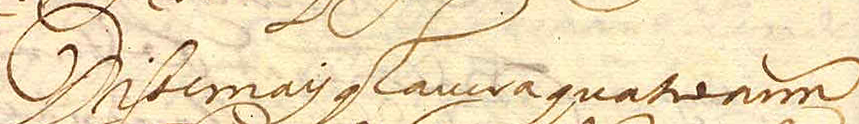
Disse mais q̄ hauera quatro ann̄
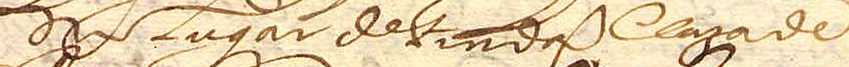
no Lugar de Fundaõ E caza de
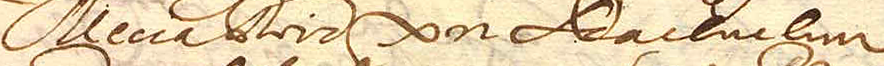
Mecia Roiz̄ xn Se achou em
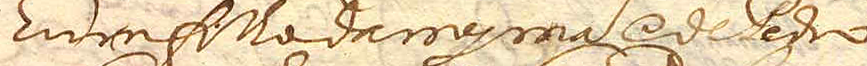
hum filho da mesma e de Pedro
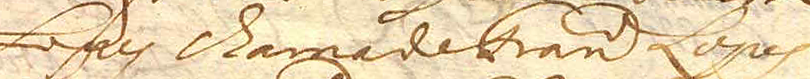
Lopes chamado Franco Lopes
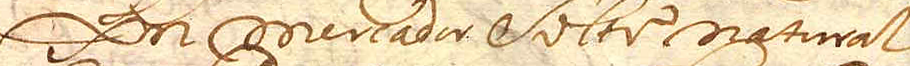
xn mercador soltro natural
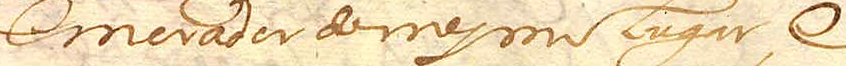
E morador do mesmo Lugar, E
